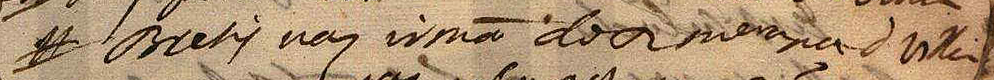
item Bretis uaz irmã do R mora na d villa
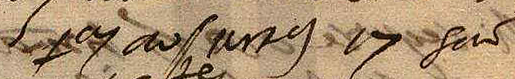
tas ao // artos 17 saõ
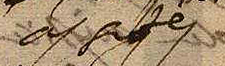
as segtes
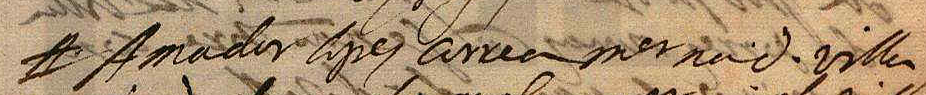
item Amador lopez correa mor na d. villa
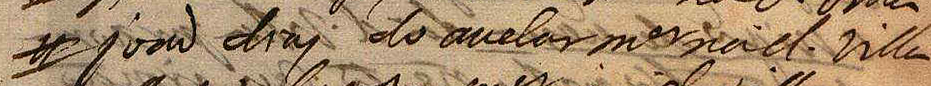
item joaõ dias do auelar mor na d. villa
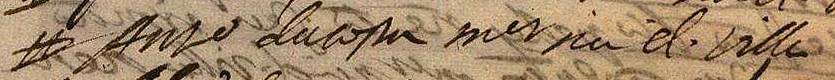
item Anto da costa merna de Villa
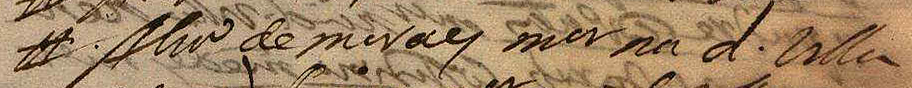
item Aluo de moraes mor na d. villa
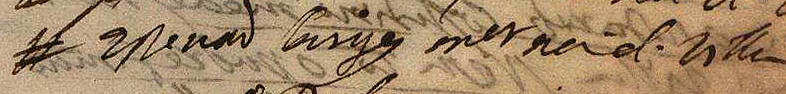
item Esteuaõ borges mor na d. villa
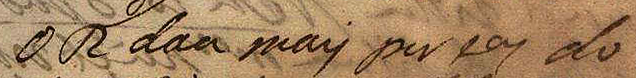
o R daa mais por tas do
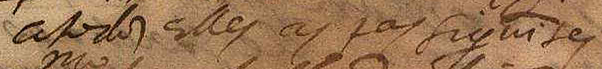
a todos Elles as tas siguītes
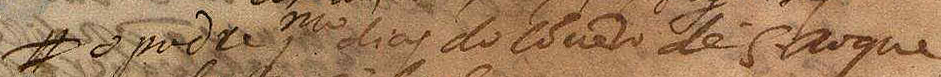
item o padre jmo dias do cōuēto de S. Roque
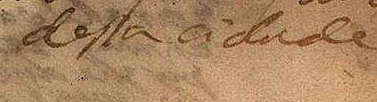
desta cidade
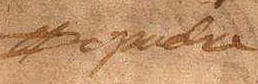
item o padre
